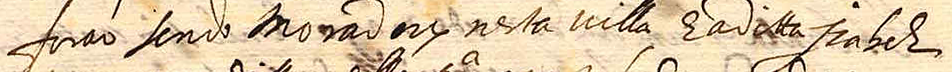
forão sendo moradores nesta uilla, E a ditta JzabeL
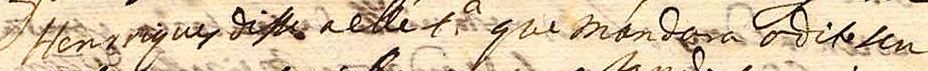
Herriques disse a elle t.a que mandara o dito seu
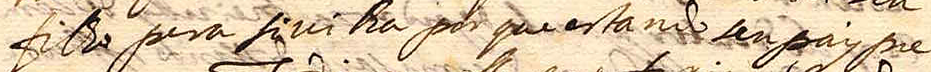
filho pera siuilha porque estando seu pay pre
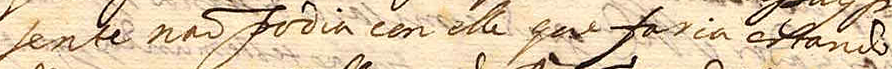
sente naõ podia con elle que faria estando
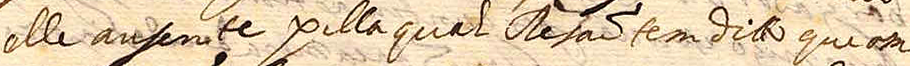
elle ausente pella qual Resaõ tem ditto que om
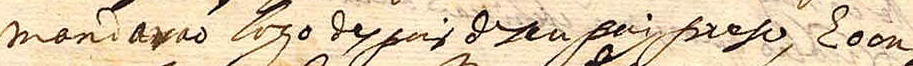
mandaraõ logo despois de seu pay preso, E o ou
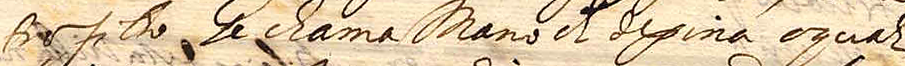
tro filho se chama Manoel de pina o quaL
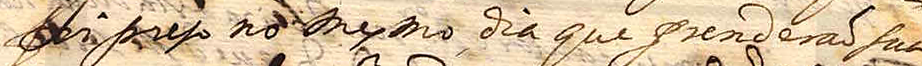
foi preso no mesmo dia que prenderão sua
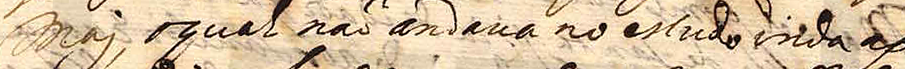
Maj, o qual naõ andaua no estudo inda ap
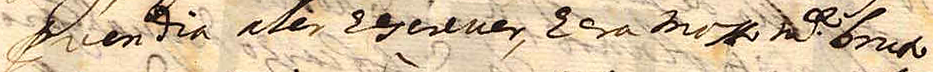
preendia a ler E escreuer, E era mosso m.to bruto
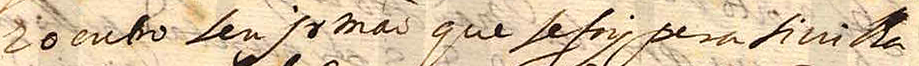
E o outro seu jrmão que se foy pera siuilha
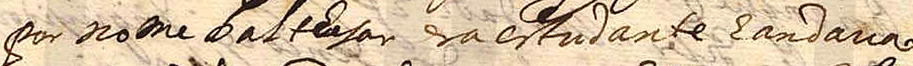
por nome balthesar era estudante E andaua
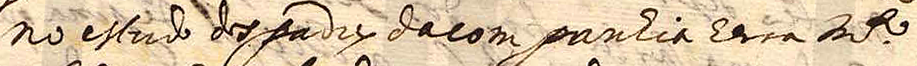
no estudo dos padres da companhia E era mto.
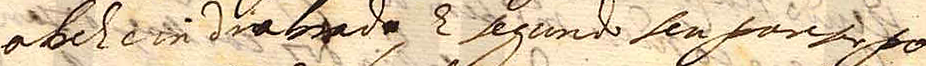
abel e indiabrado E segundo seu pareser po
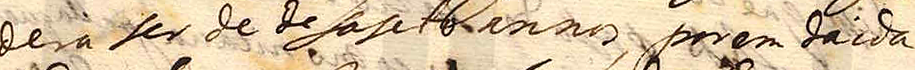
dera ser de desaseto annos, porem da ida
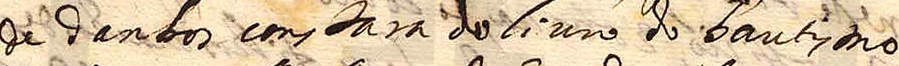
de danbos constara do liuro do bautismo
